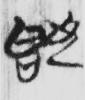既
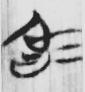爲
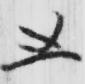之
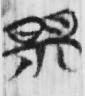○（盟）
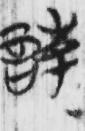○（證）
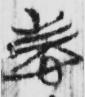慶
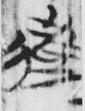逃
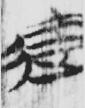○（解）
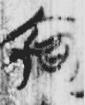○（拘）
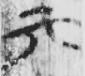亓（其）
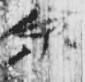余
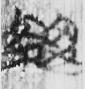執
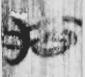𨟻（將）
